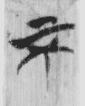不
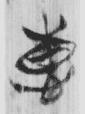惠
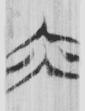亦
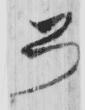乃
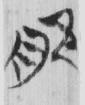服
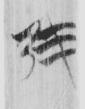隹
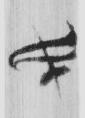民
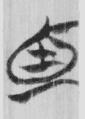卣
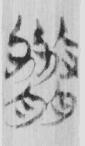{力肉力肉攴}
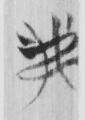弗
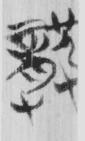{𦚏兄廾}
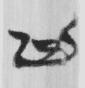𠀠
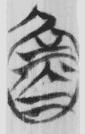魯
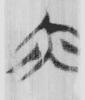亦
